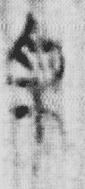色
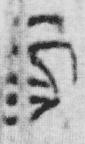耳
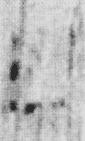之
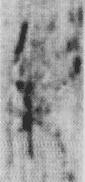樂
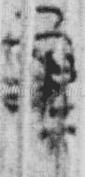聖（聲）
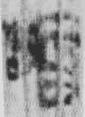{曰耳}（鬱）
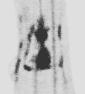缶（陶）
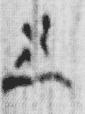之
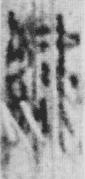○（氣）
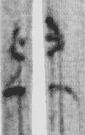也
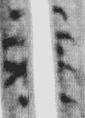不
